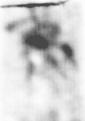黃
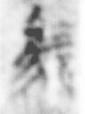馭（御）
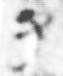父
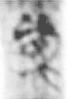慶（卿）
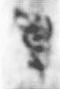事（士）
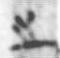之
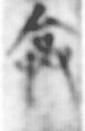弇
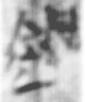銅
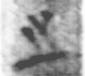之
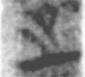之
